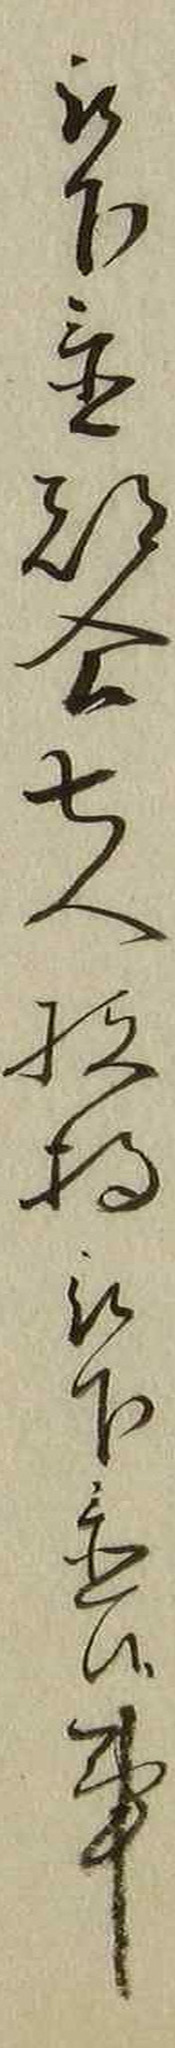被下置都合七人扶持被下置候事
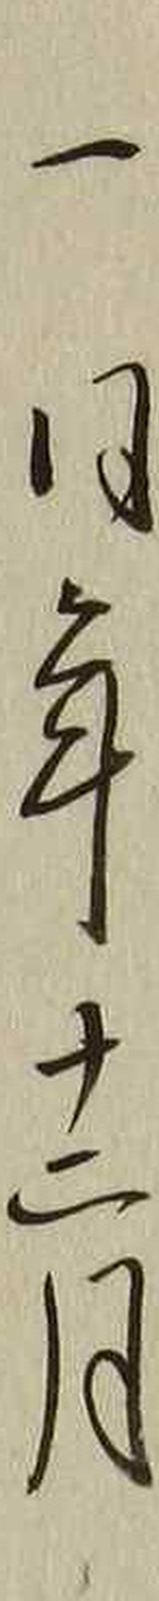一同年十二月
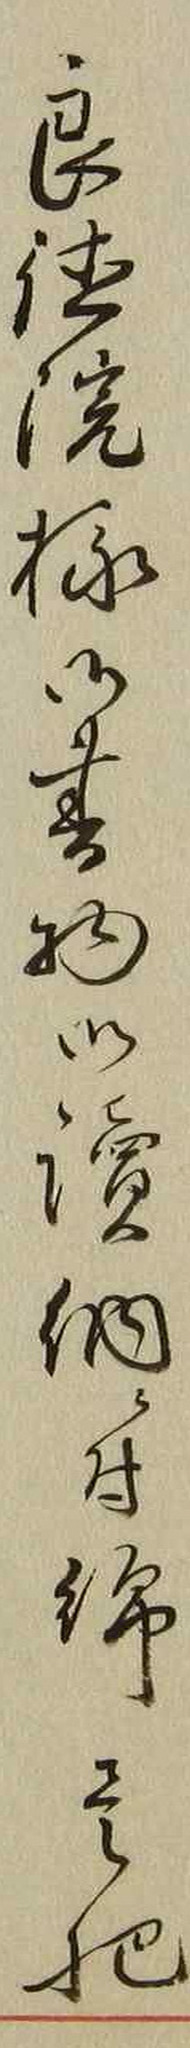良徳院様御書物御読納に付綿壱把
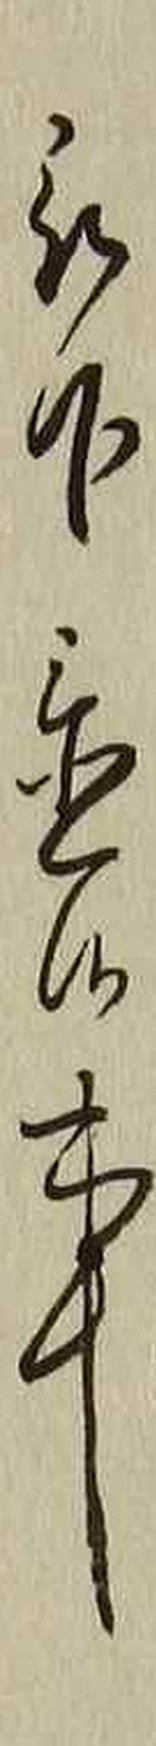被下置候事
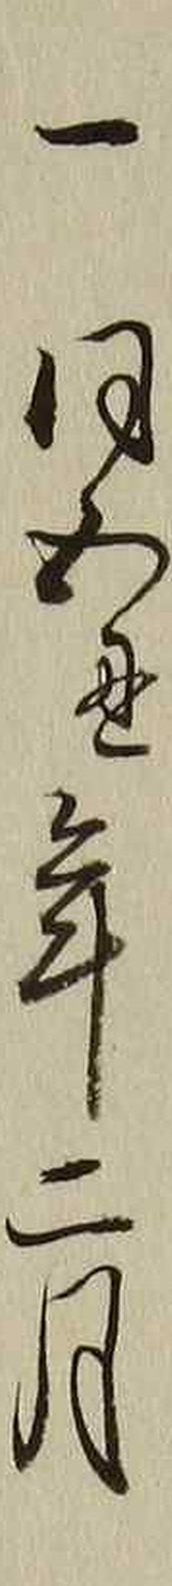一同五丑年二月
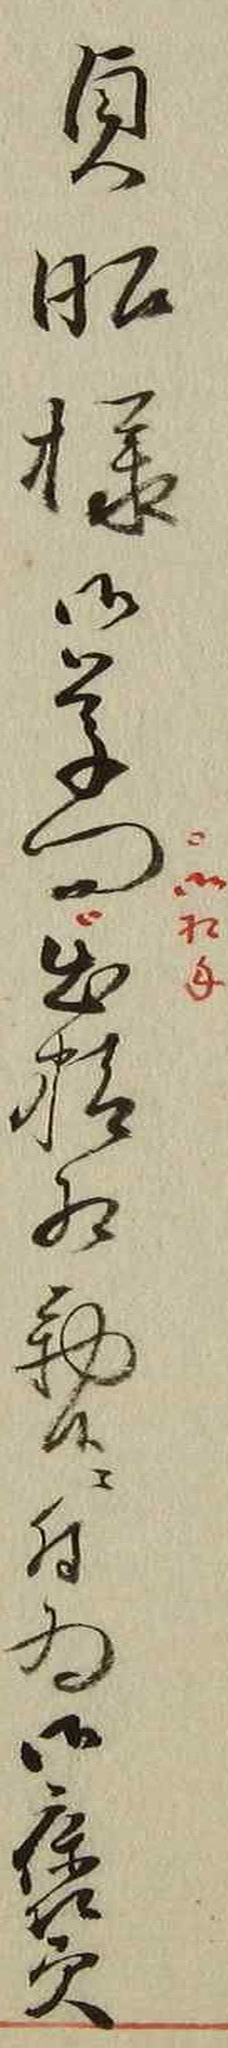貞昭様御学問出精相勤候に付為御褒美
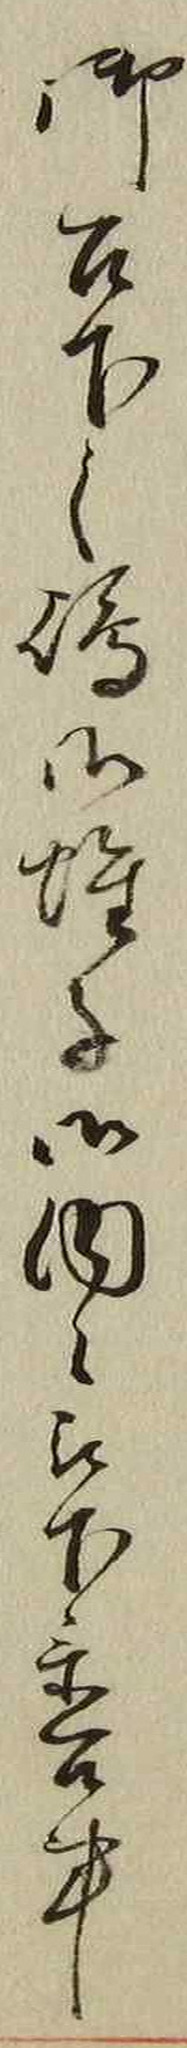御召下之嶋御帷子御内々被下置候事
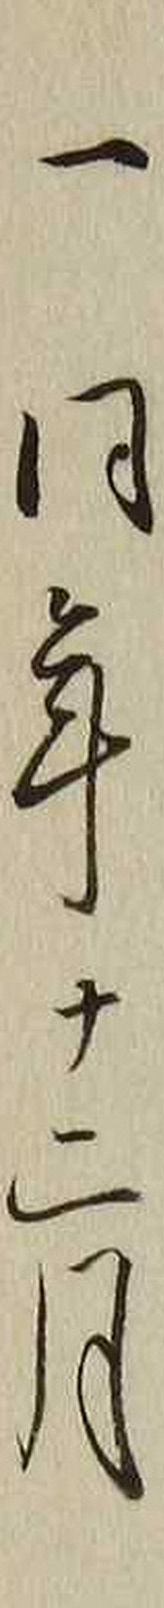一同年十二月
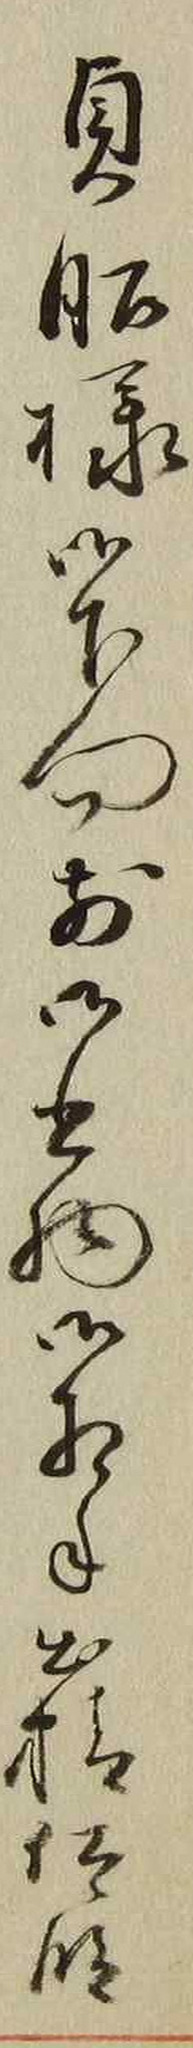貞昭院様御下向前御書物御相手出精仕候段
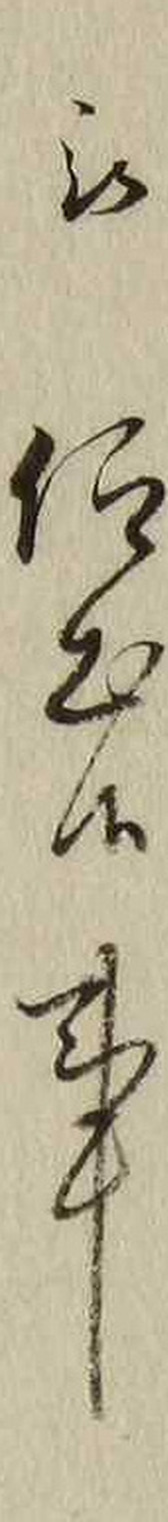被仰出候事
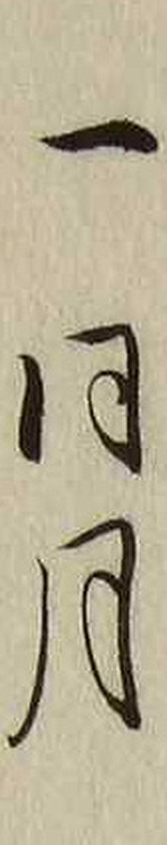一同月
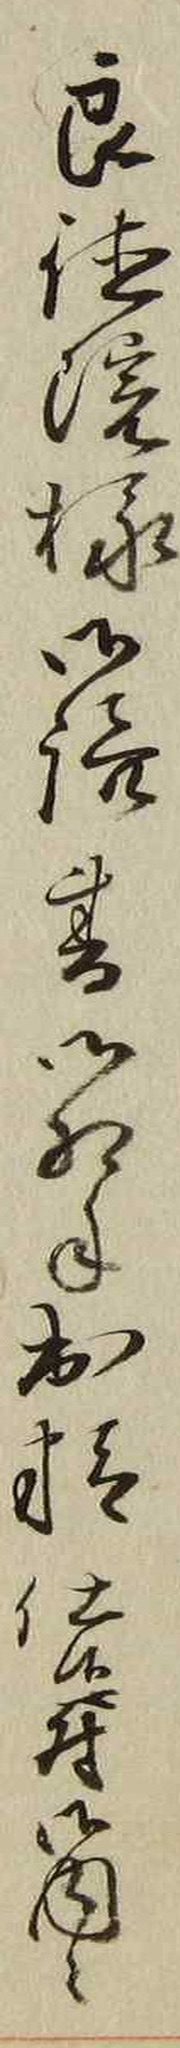良徳院様御読書御相手出精仕候に付御内々
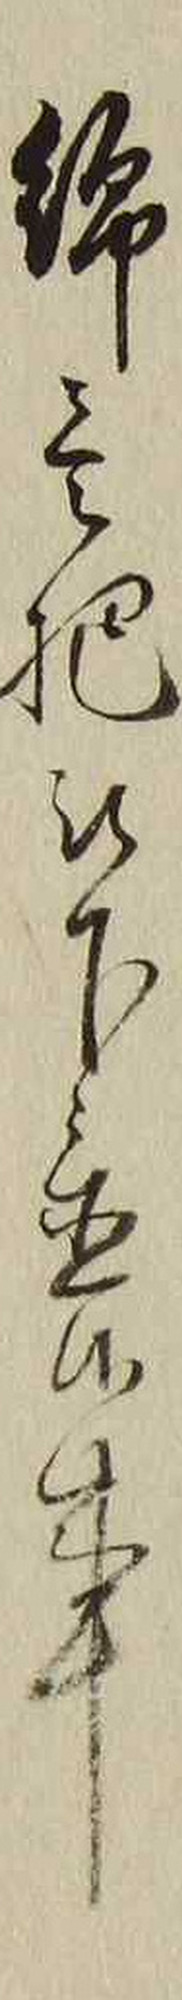綿壱把被下置候事
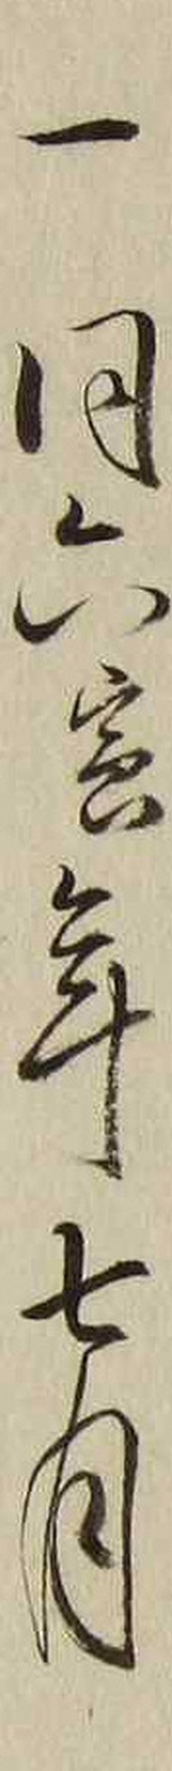一同六寅年七月

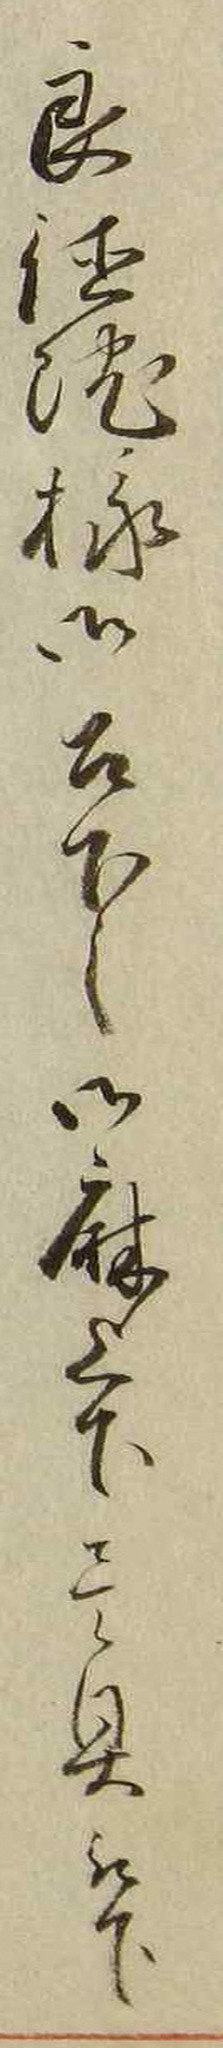良徳院様御召下之御麻上下壱具被下
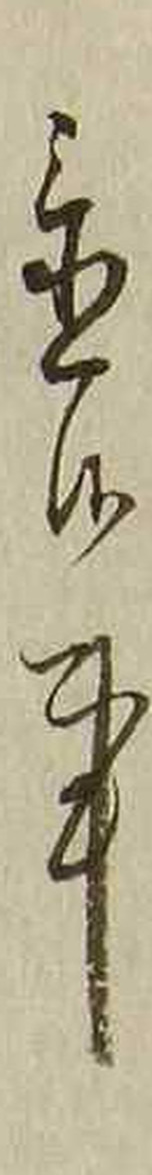置候事
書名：諸士系譜　巻之3　い之部3
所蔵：会津若松市立会津図書館
